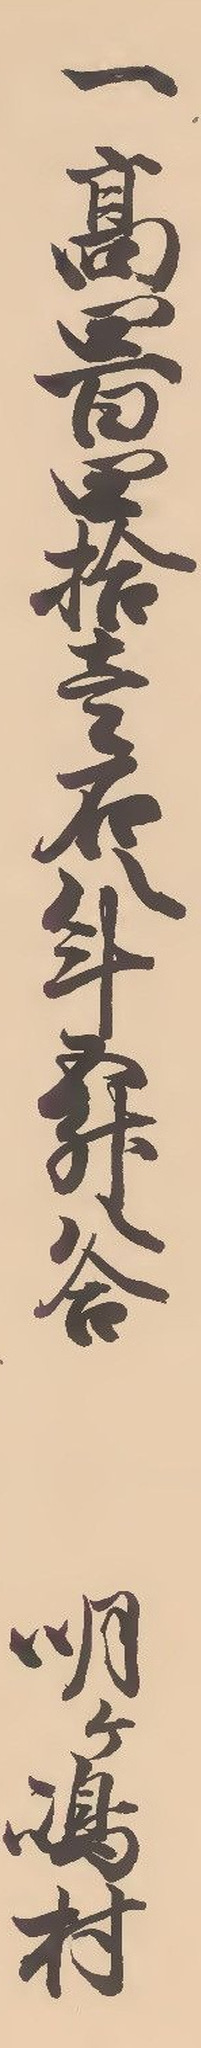一高四百四拾壱石八斗五升八合明ヶ島村
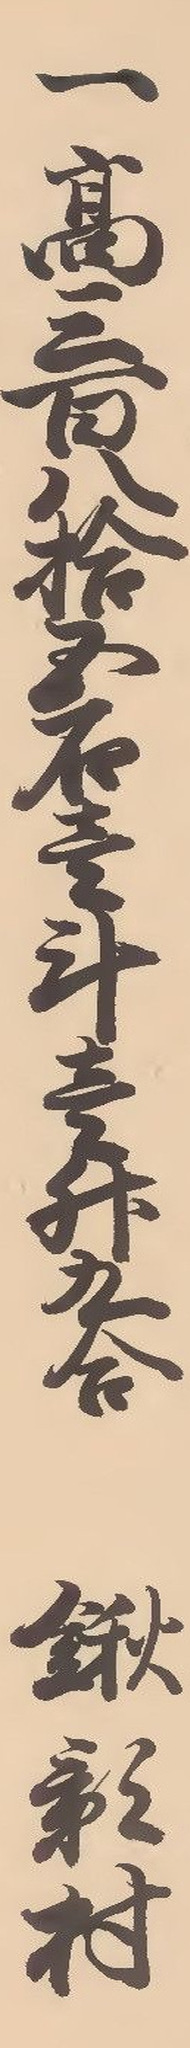一高三百八拾五石壱斗壱升九合鍬影村
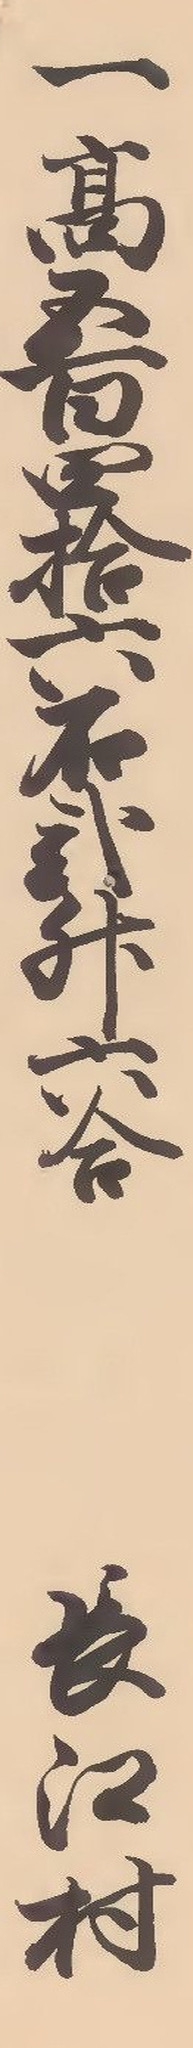一高五百四拾六石弐升六合長江村
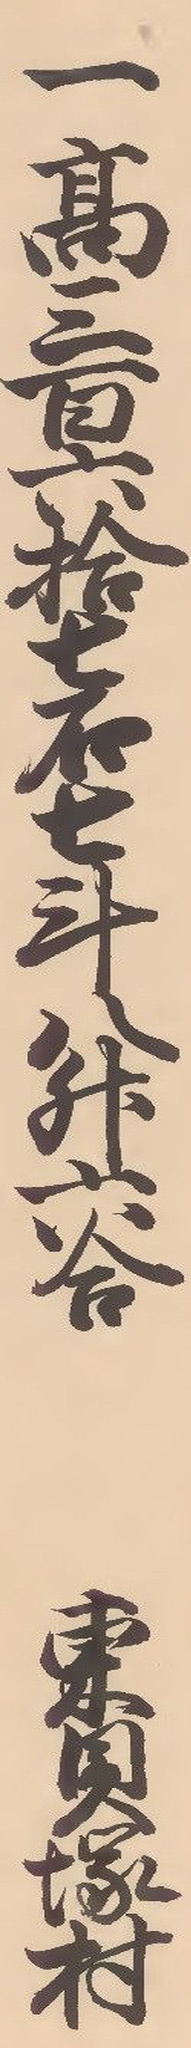一高三百六拾七石七斗八升六合東貝塚村

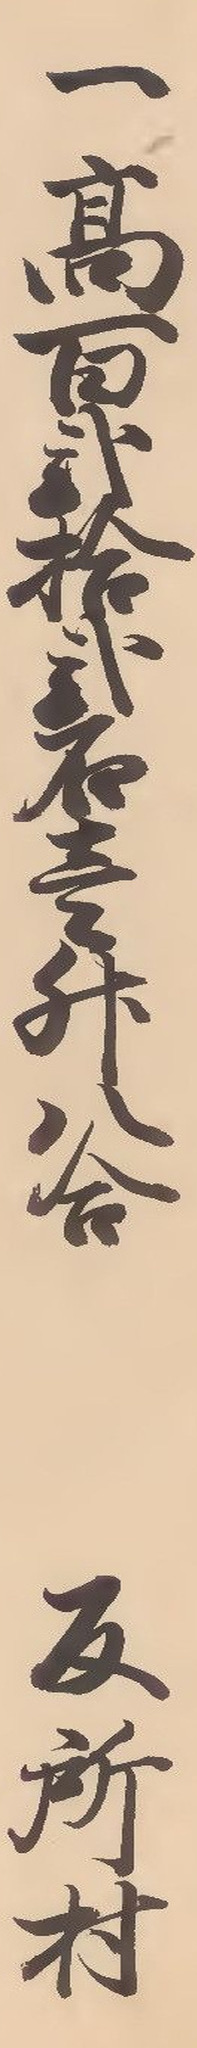一高百弐拾弐石壱升八合反所村
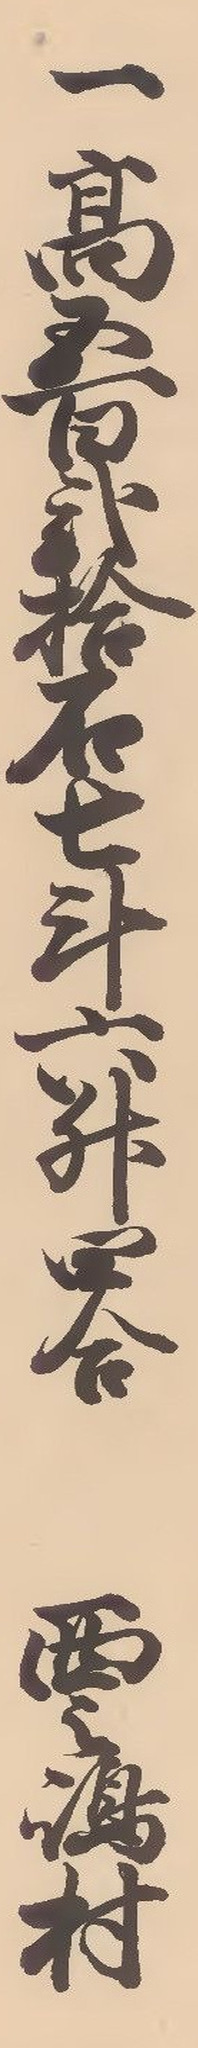一高五百弐拾石七斗六升四合西之島村
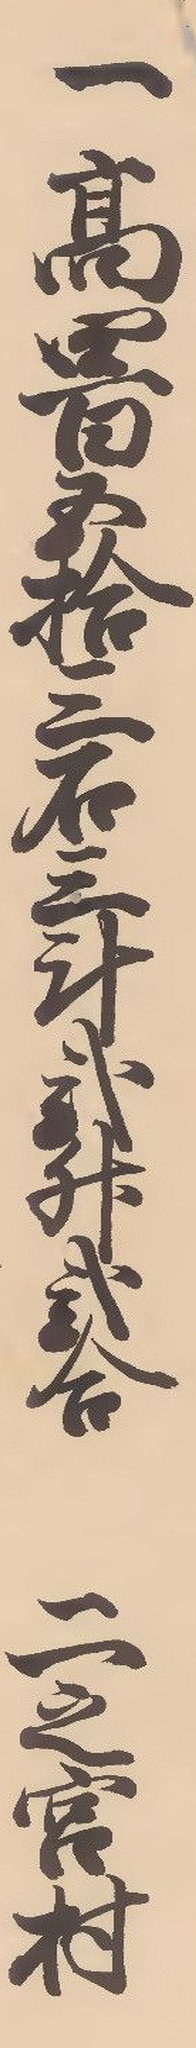一高四百五拾三石三斗弐升弐合二之宮村
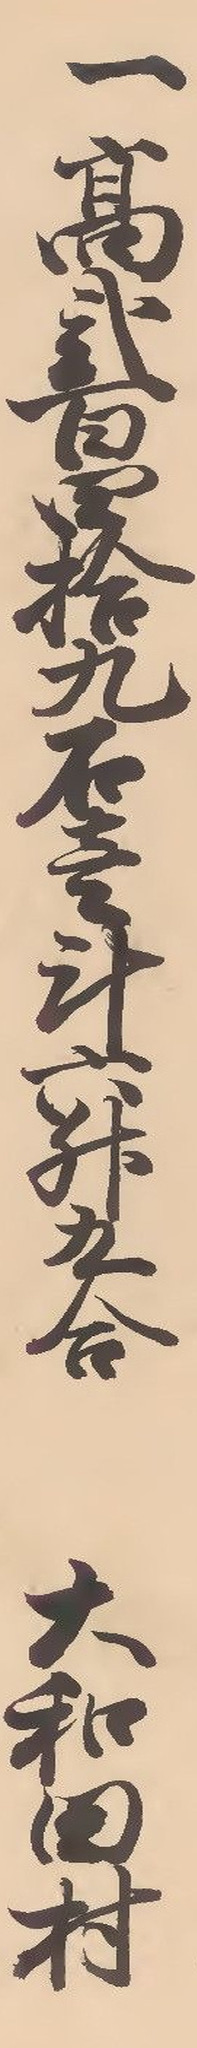一高弐百四拾九石壱斗六升九合大和田村
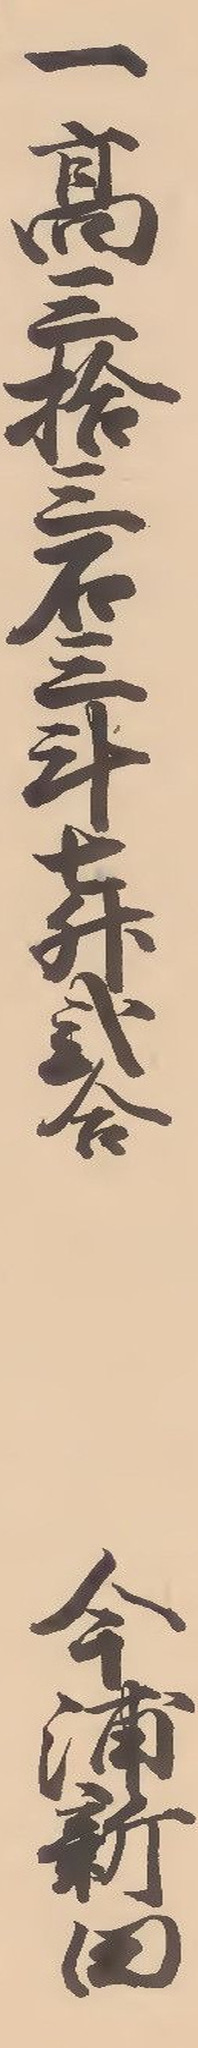一高三拾三石三斗七升弐合今浦新田
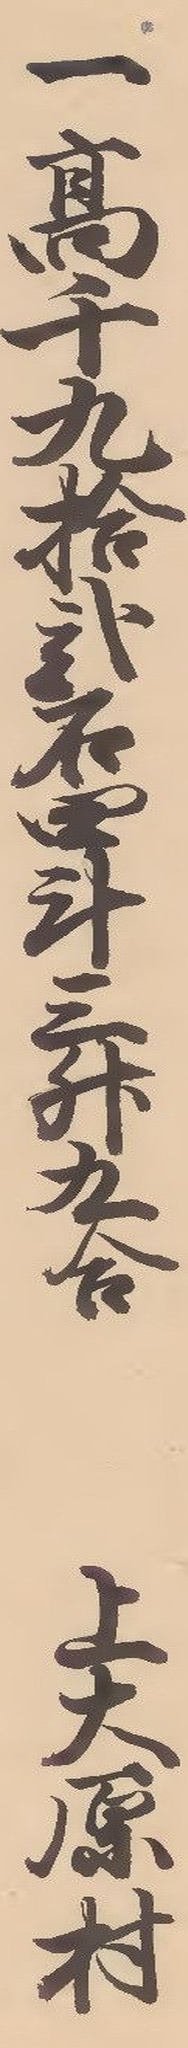一高千九拾弐石四斗三升九合上大原村
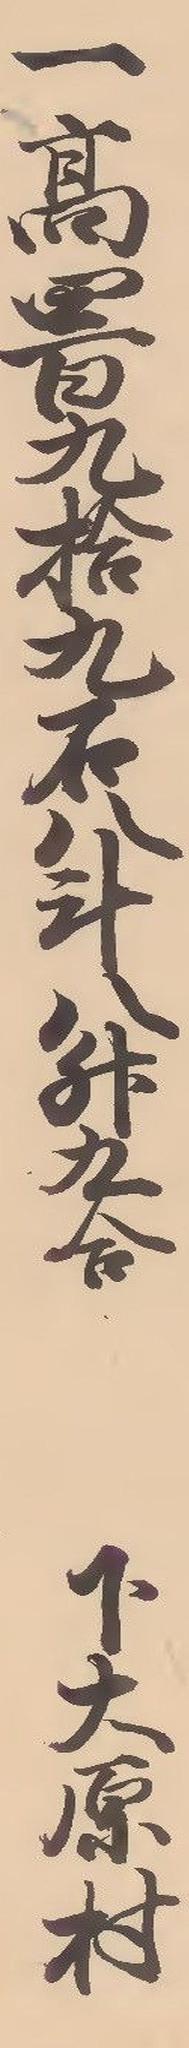一高四百九拾九石八斗八升九合下大原村

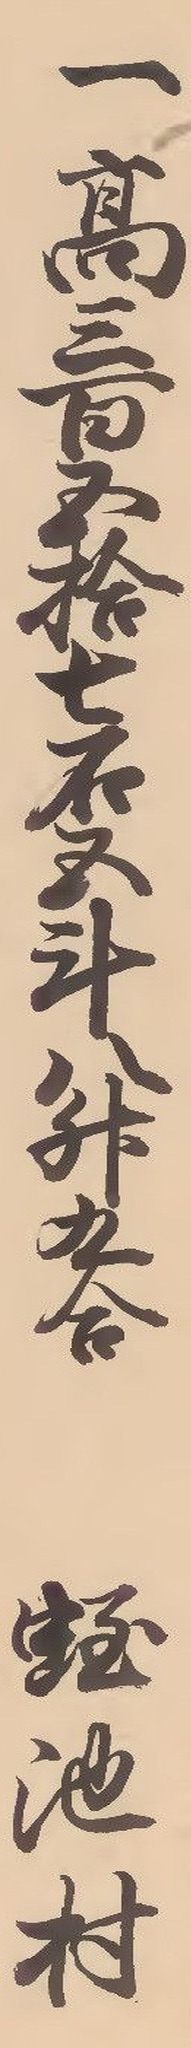一高三百五拾七石五斗八升九合蛭池村
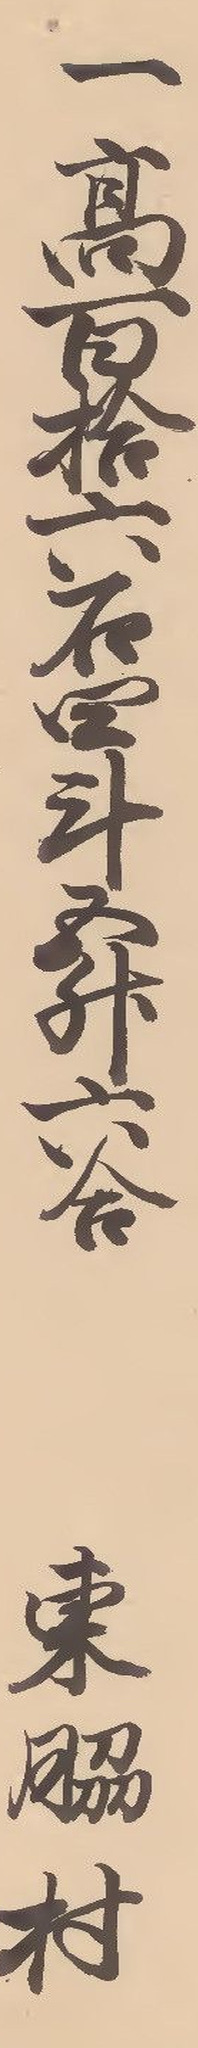一高百拾六石四斗五升六合東脇村
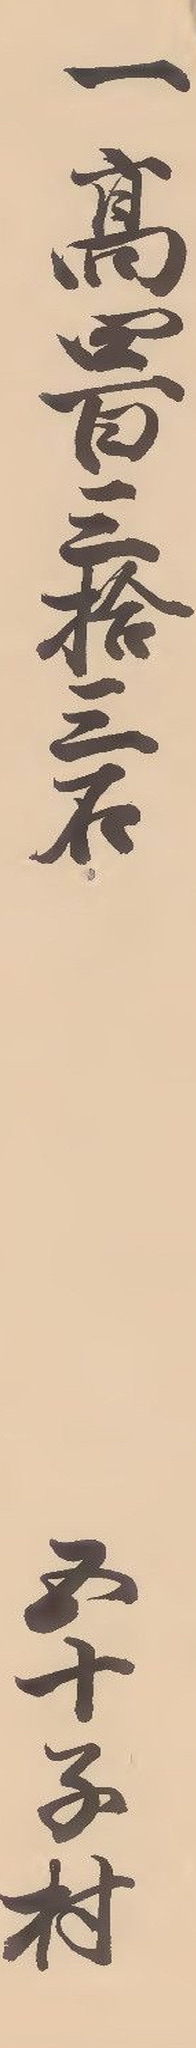一高四百三拾三石五十子村
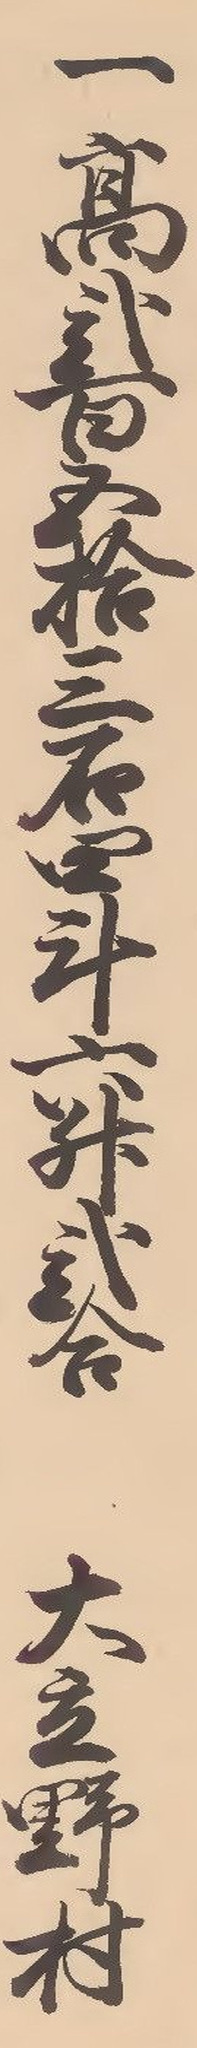一高弐百五拾三石四斗六升弐合大立野村
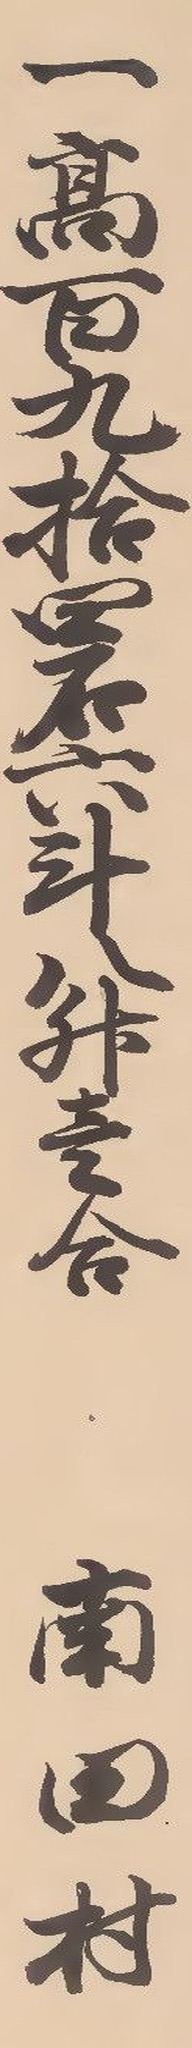一高百九拾四石六斗八升壱合南田村
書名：遠江国郷帳
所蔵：国立公文書館 National Archives of Japan
